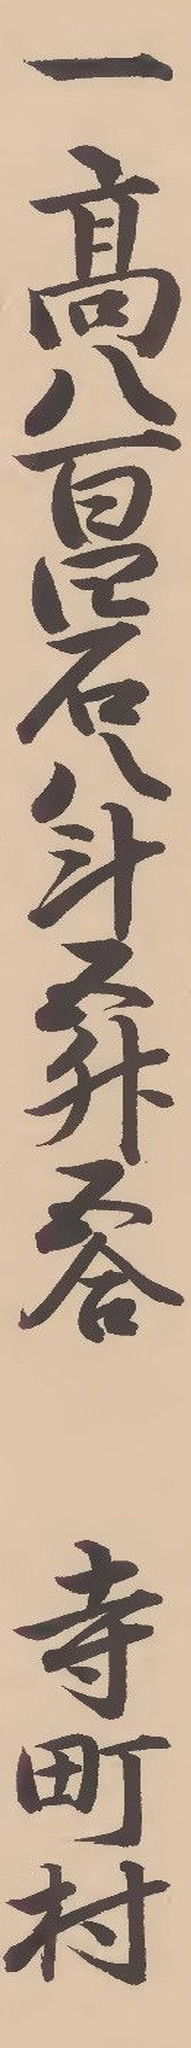一高八百四石八斗五升五合寺町村
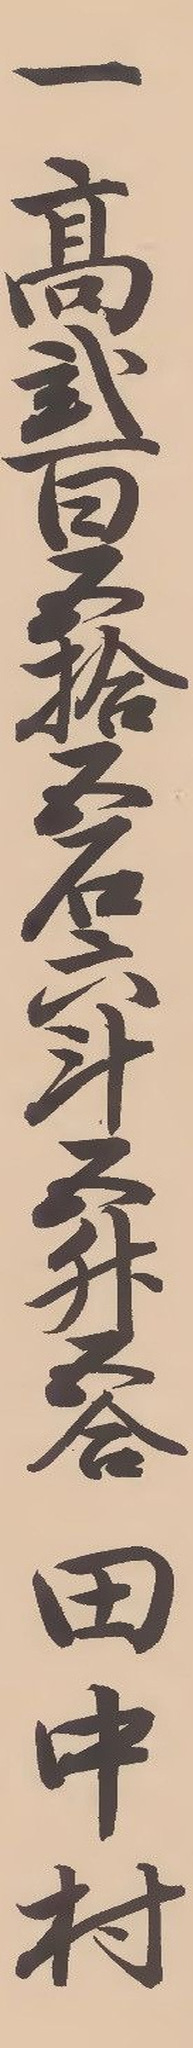一高弐百五拾五石六斗五升五合田中村
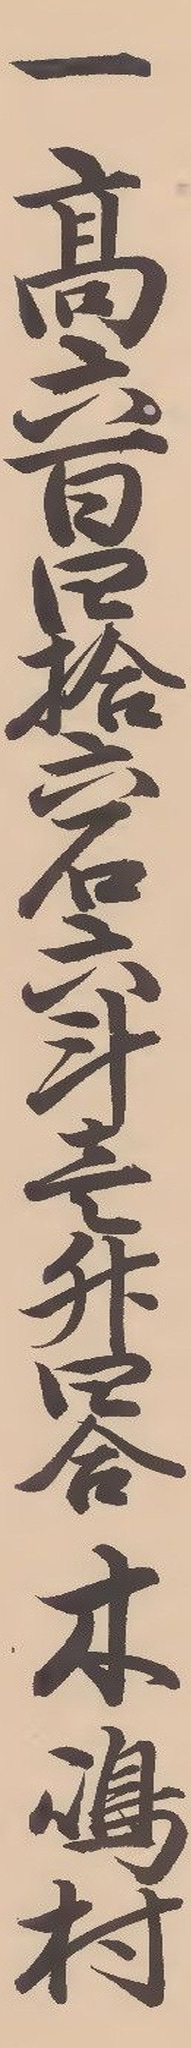一高六百四拾六石六斗壱升四合木島村
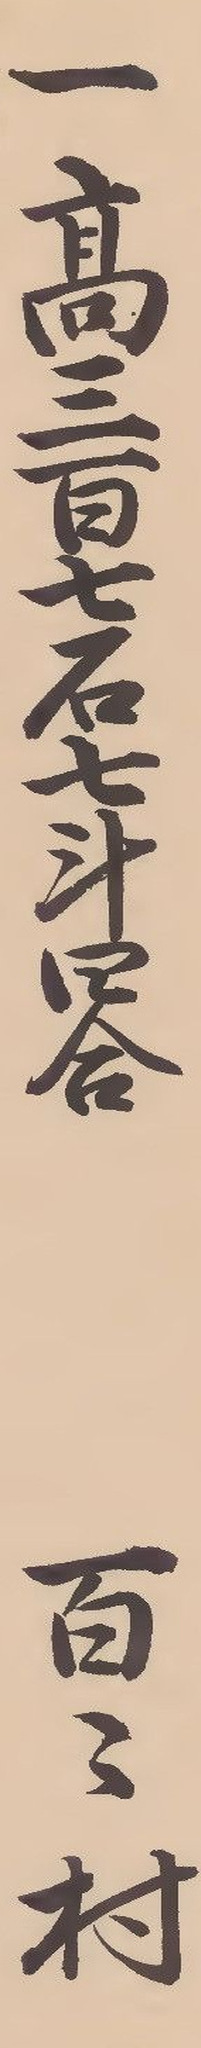一高三百七石七斗四合百々村
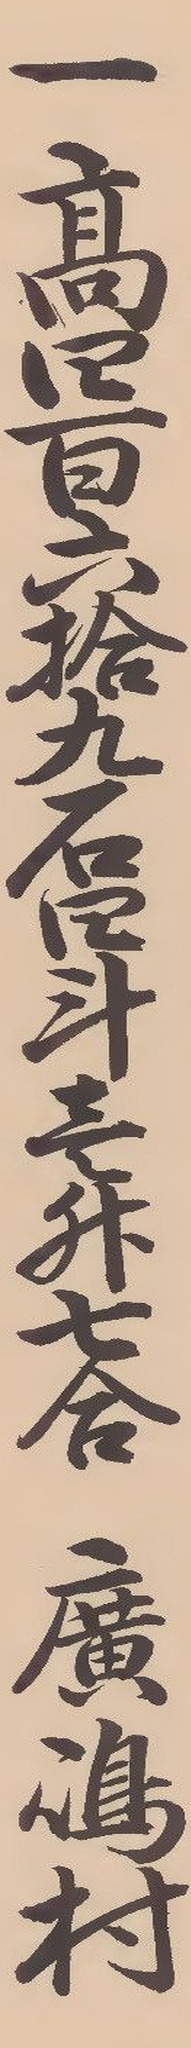一高四百六拾九石四斗壱升七合広島村

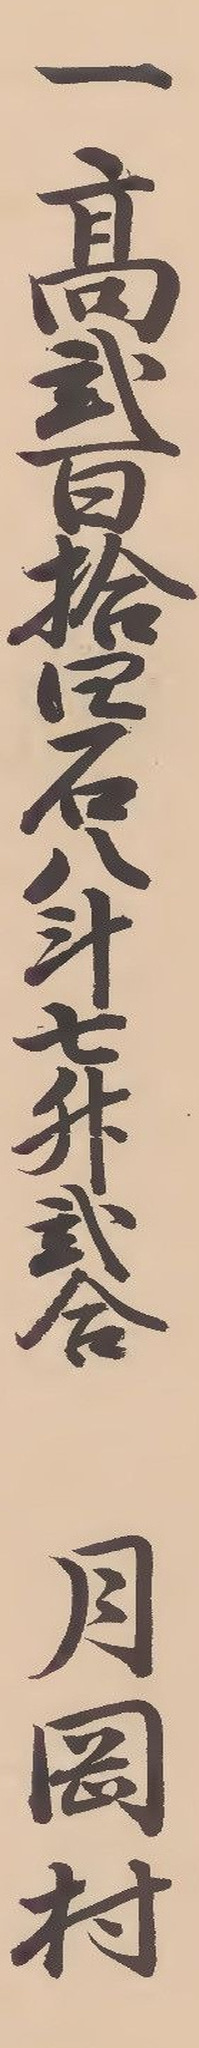一高弐百拾四石八斗七升弐合月岡村
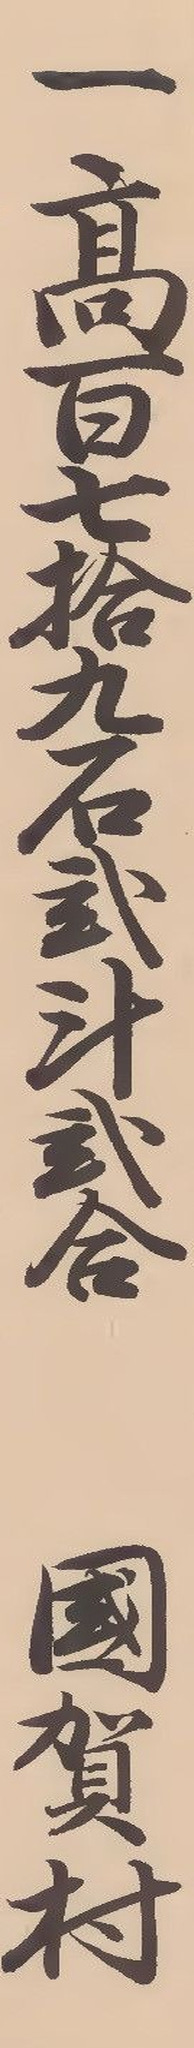一高百七拾九石弐斗弐合国賀村
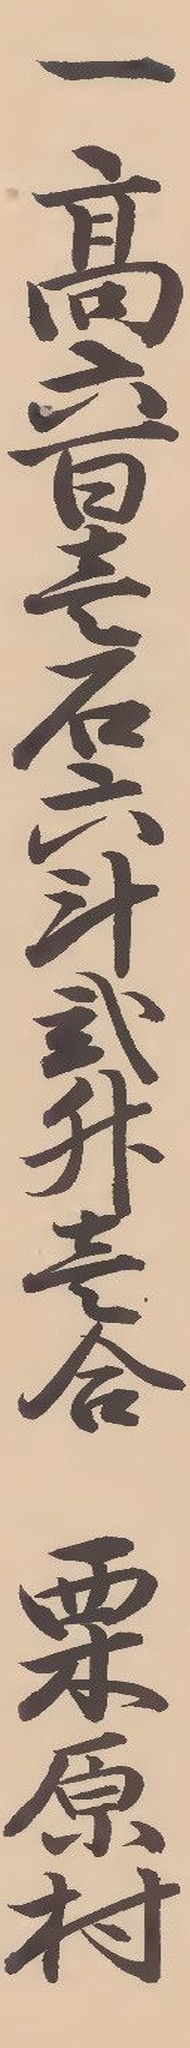一高六百壱石六斗弐升壱合栗原村
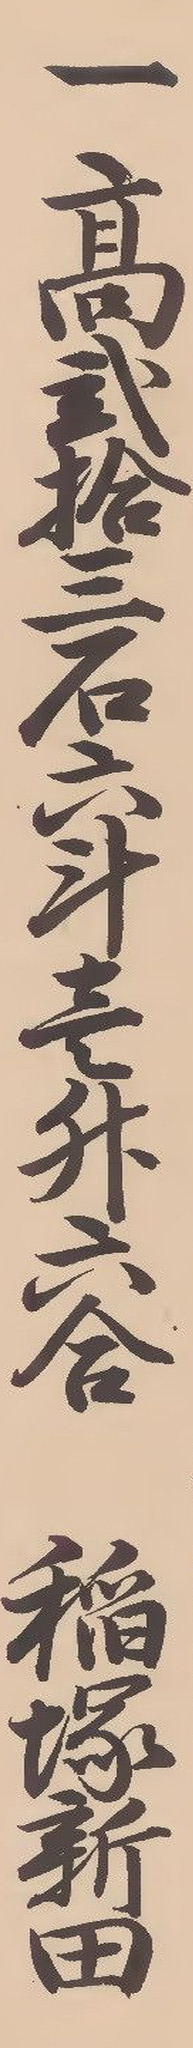一高弐拾三石六斗壱升六合稲塚新田
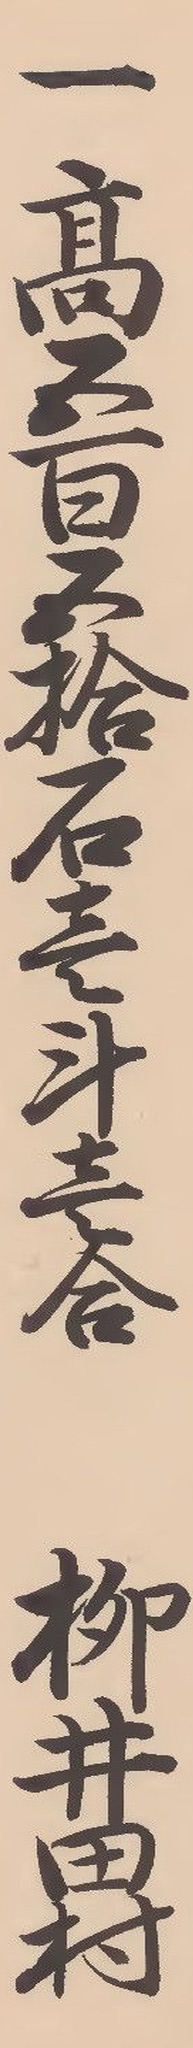一高五百五拾石壱斗壱合柳井田村
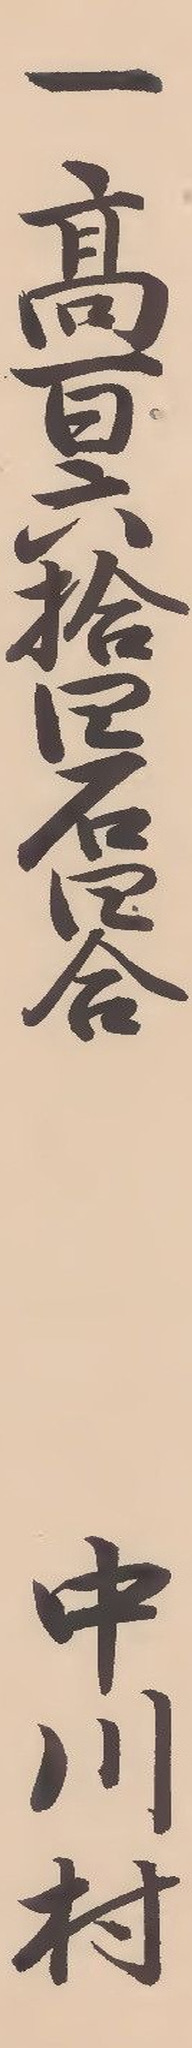一高百六拾四石四合中川村
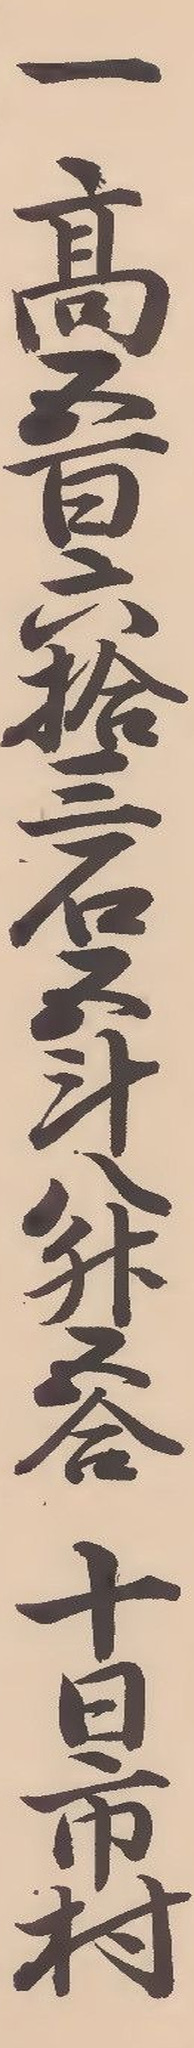一高五百六拾三石五斗八升五合十日市村
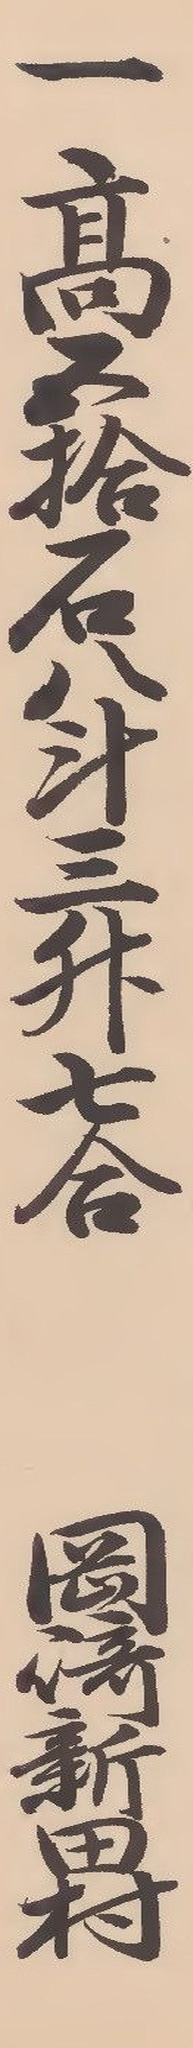一高五拾石八斗三升七合岡崎新田村

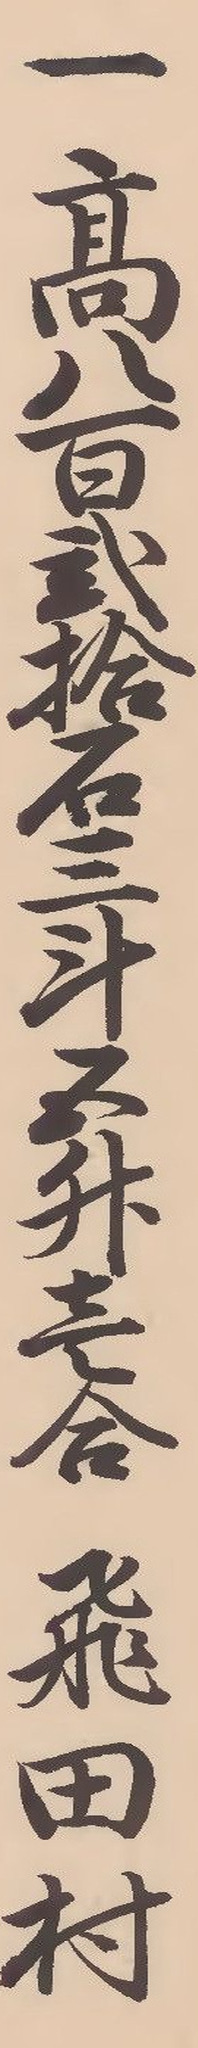一高八百弐拾石三斗五升壱合飛田村
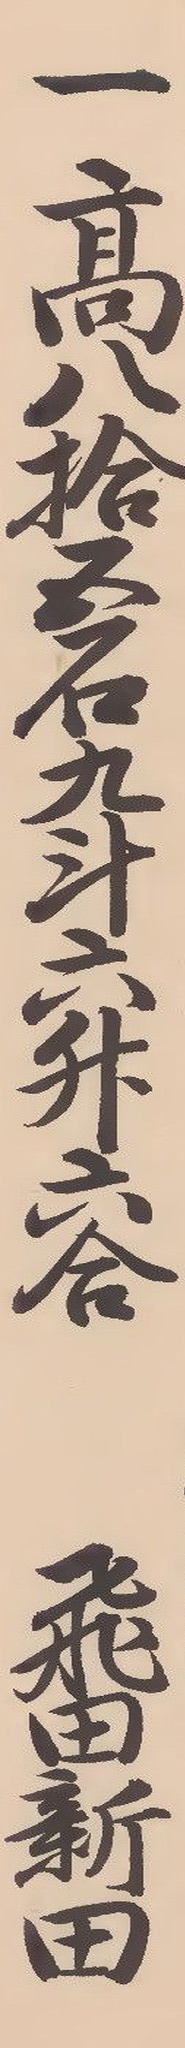一高八拾五石九斗六升六合飛田新田
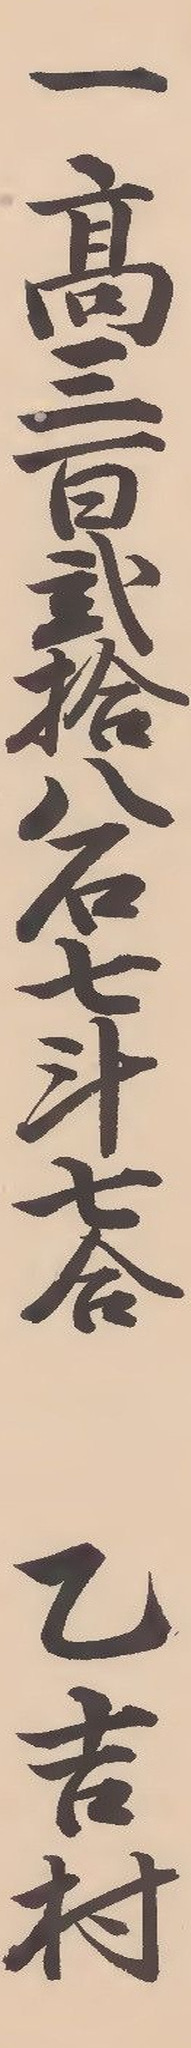一高三百弐拾八石七斗七合乙吉村
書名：越後国郷帳　上
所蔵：国立公文書館 National Archives of Japan
